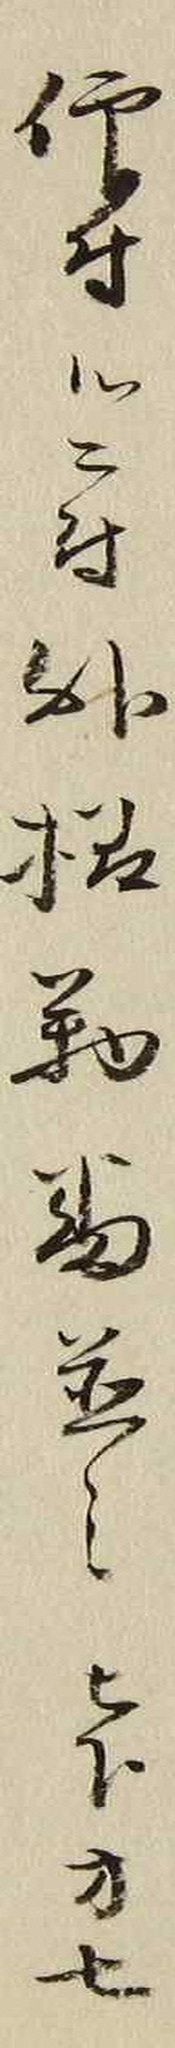仰付候ニ付外様勤番並之被下方七
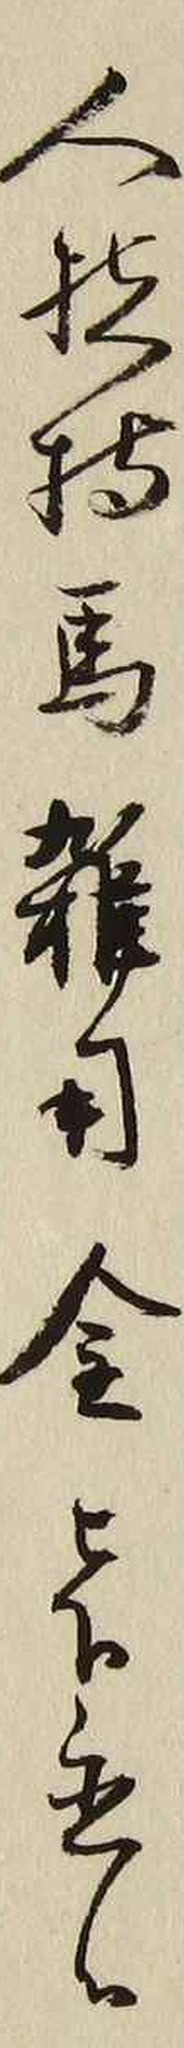人扶持馬雑用金被下置候
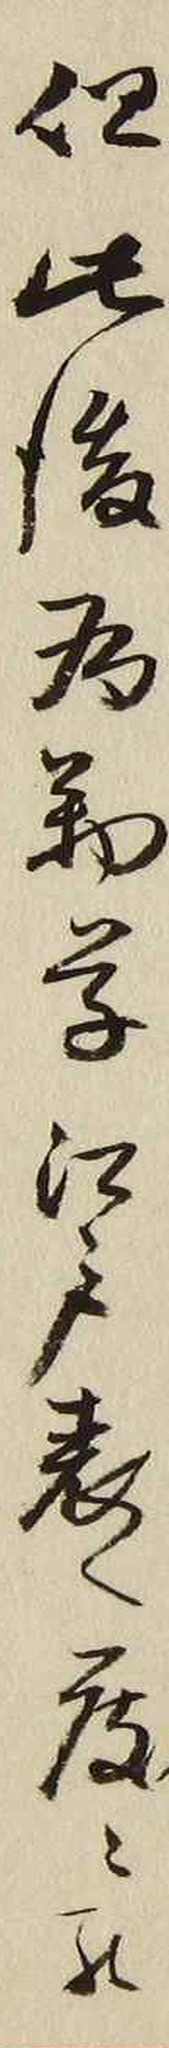但此後為勤学江戸表へ度々罷
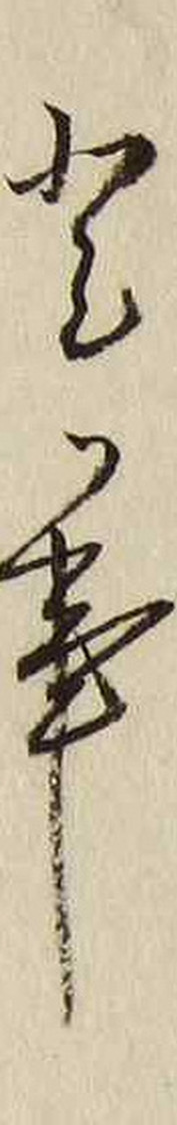登候事
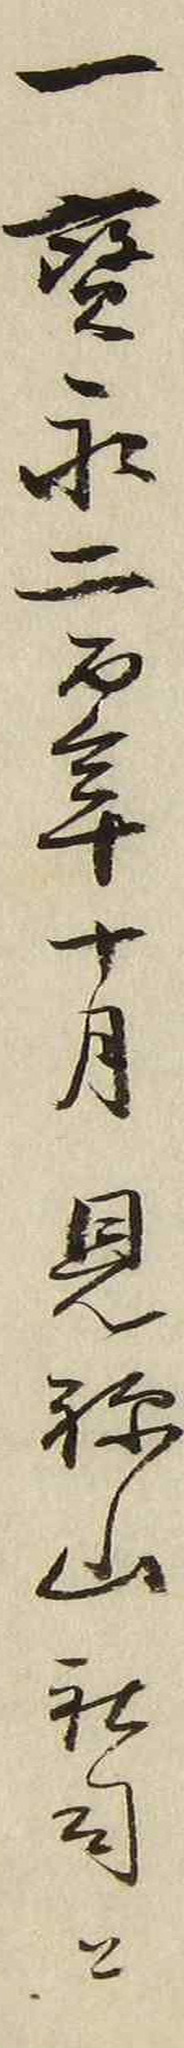一宝永二酉年十月見祢山社司と
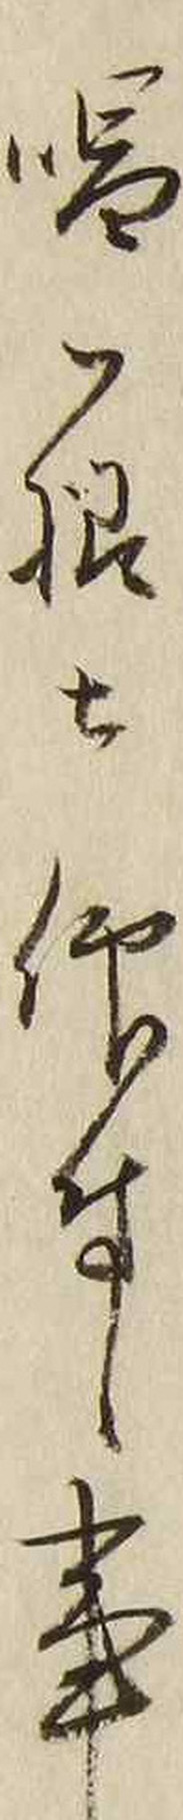唱候様被仰付候事

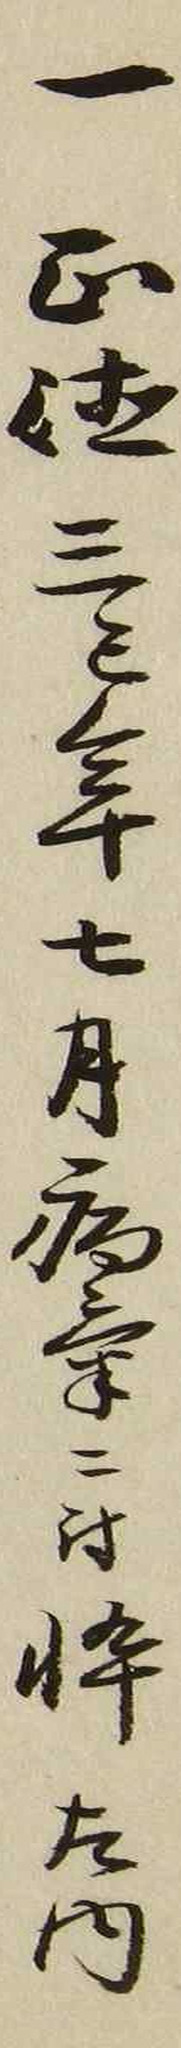一正徳三巳年七月病気ニ付忰左内
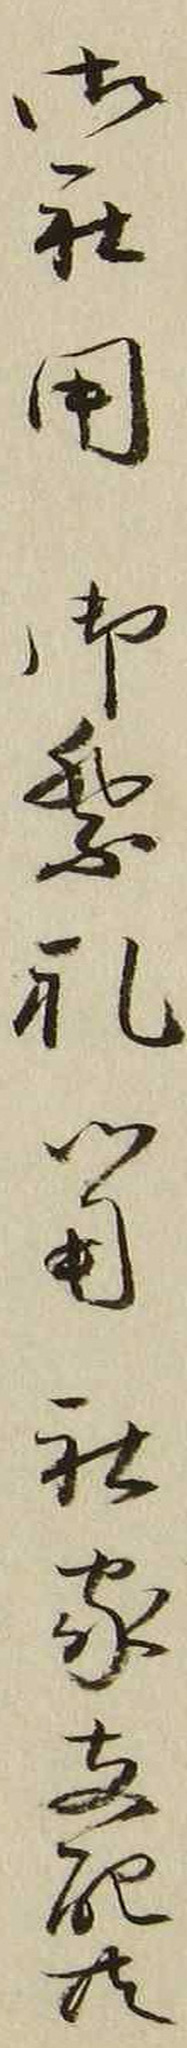御社用御祭礼御用社家支配共
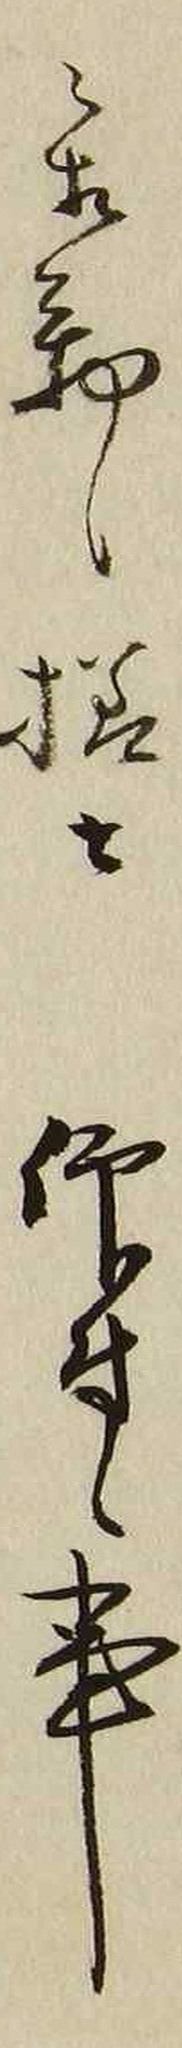ニ相勤候様被仰付候事
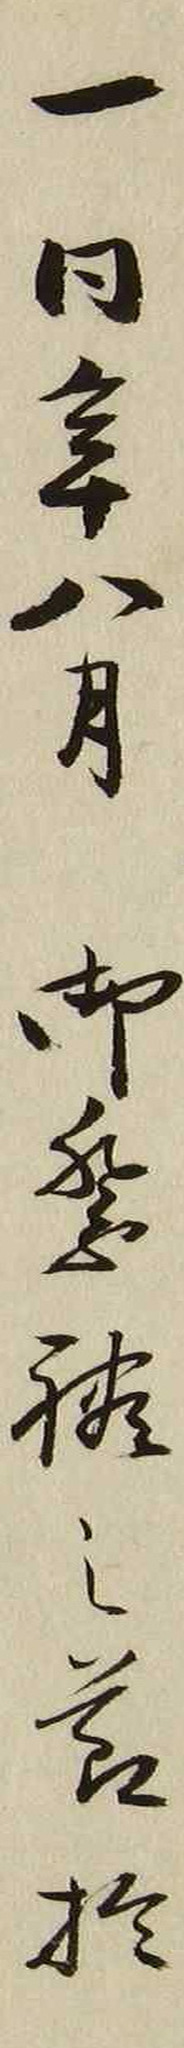一同年八月御祭礼之節於
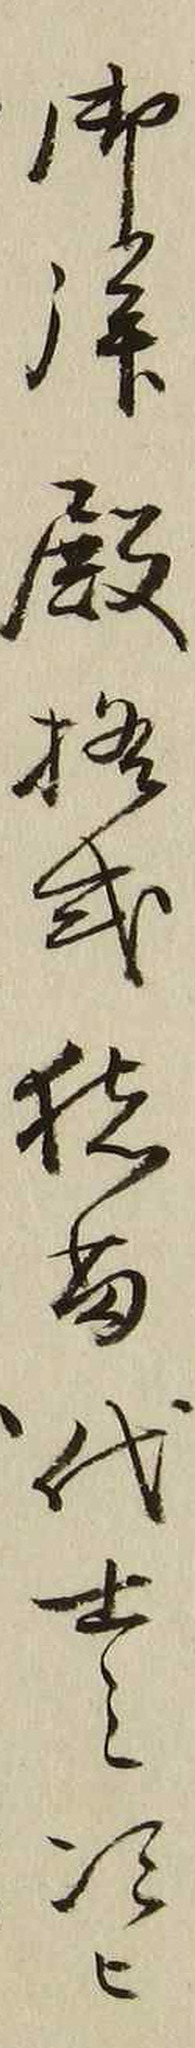御拝殿格式猪苗代士之次被
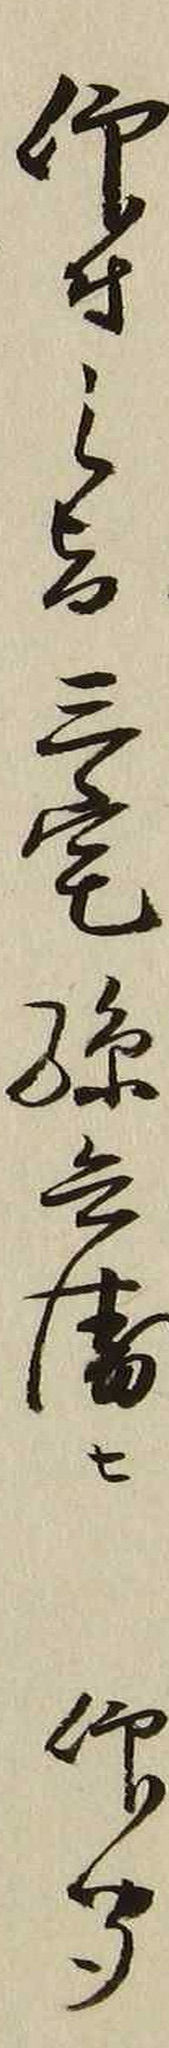仰付之旨三宅孫兵衛被仰聞
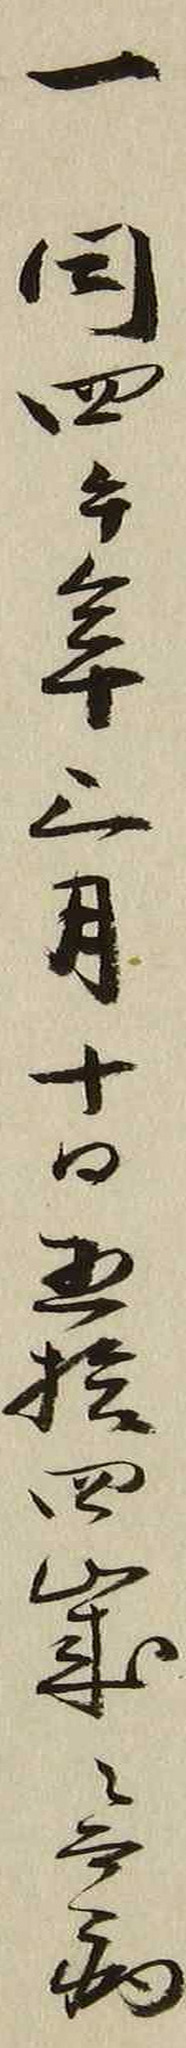一同四午年三月十日五拾四歳ニ而病
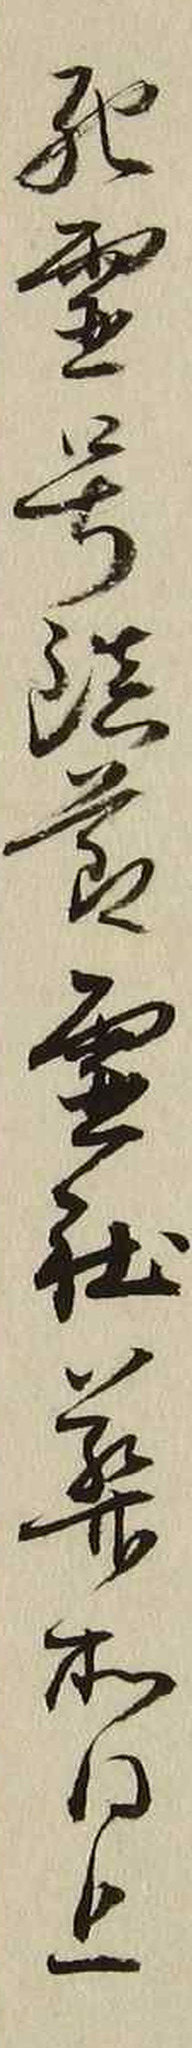死霊号鎮節霊社葬所同上
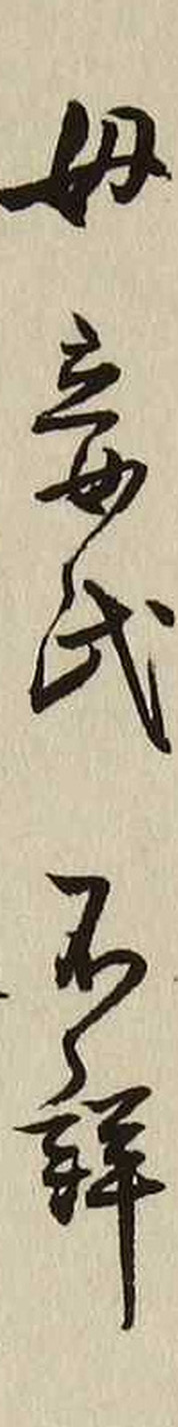母妾氏不詳
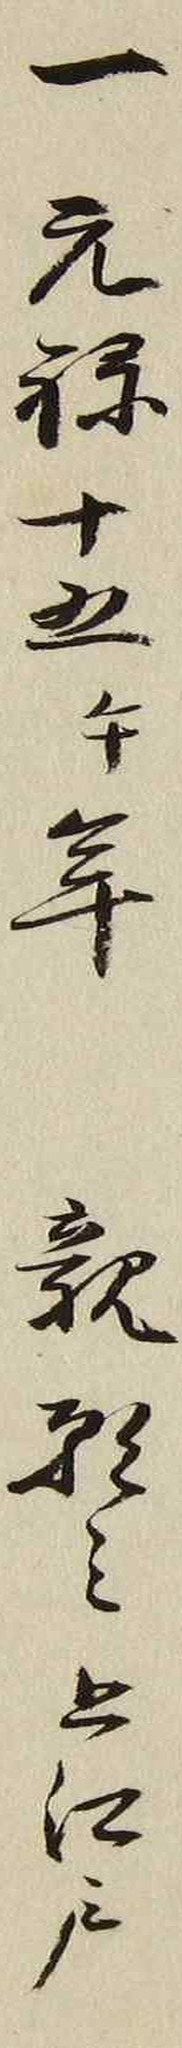一元禄十五午年親願之上江戸
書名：諸士系譜　巻之291　さ之部23
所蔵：会津若松市立会津図書館
